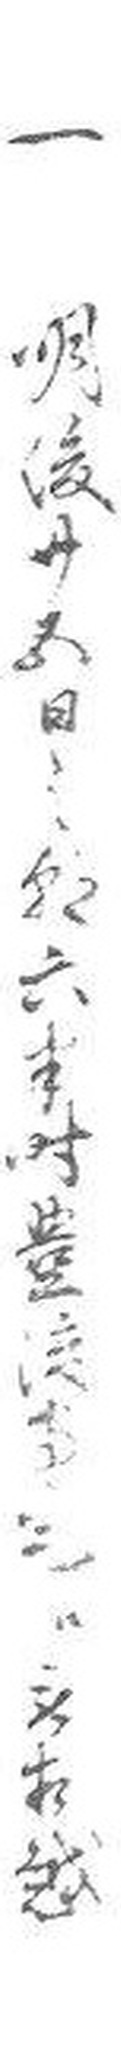一明後廿五日之朝六半時豊後守宅江被相越
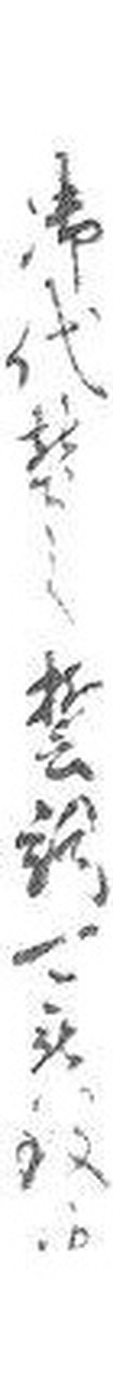御代替之誓詞可被致候
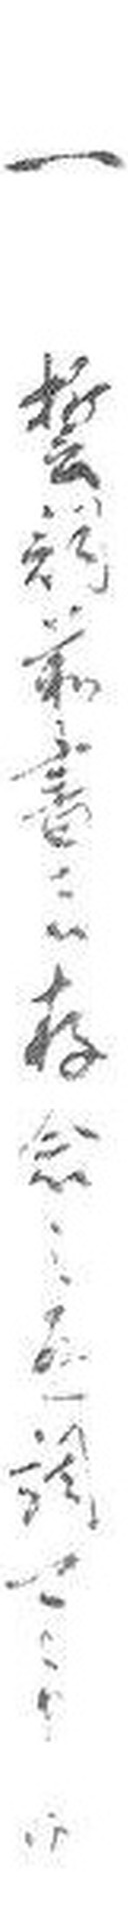一誓詞前書者存念之趣詞可被申候
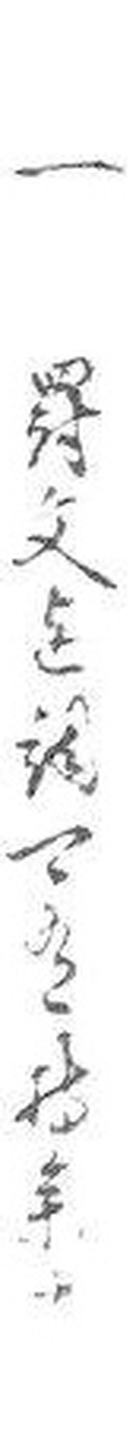一爵文迄調可有持参候
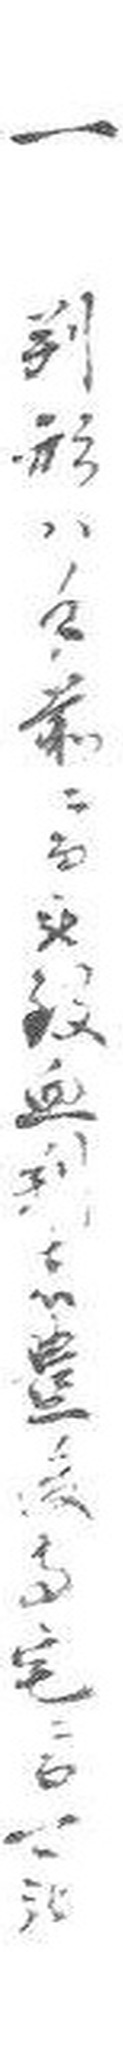一判形ハ其前ニ而被致血判者豊後守宅ニ而可被
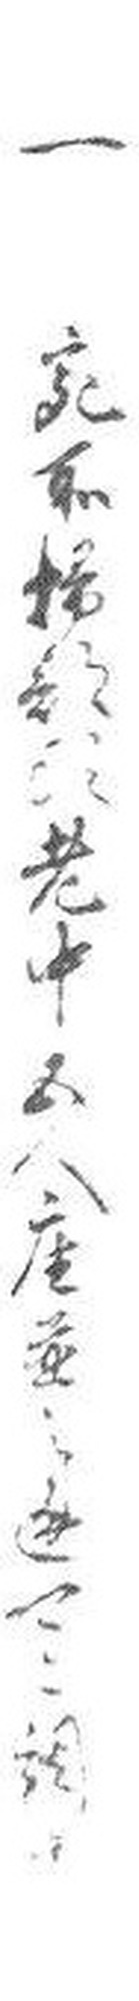一宛所掃部頭老中五人座並之通可被調候
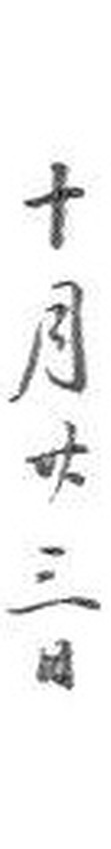十月廿三日
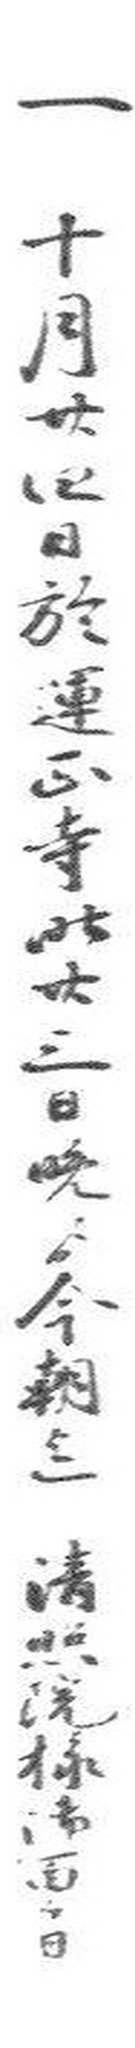一十月廿四日於運正寺昨廿三日晩ゟ今朝迄清照院様百ケ日
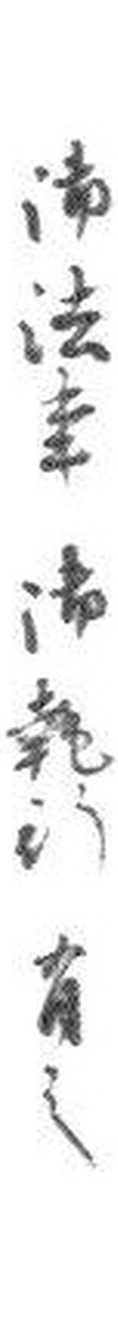御法事御執行有之
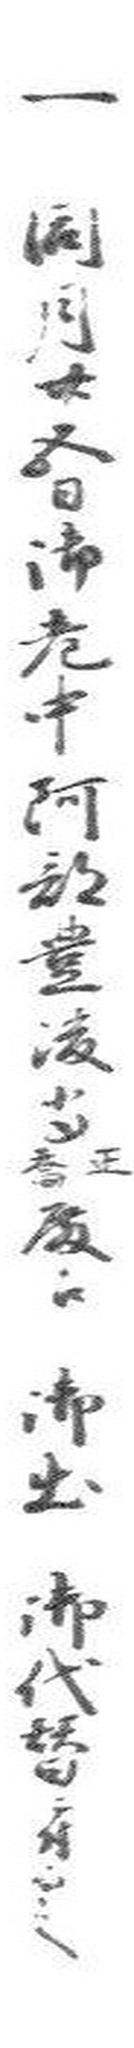一同月廿五日御老中阿部豊後守正喬殿江御出御代替ニ付而之
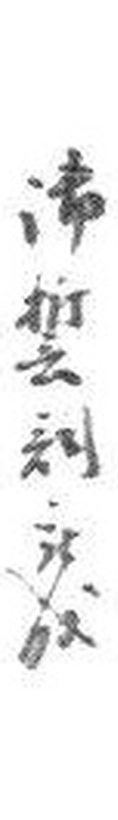御誓詞被成
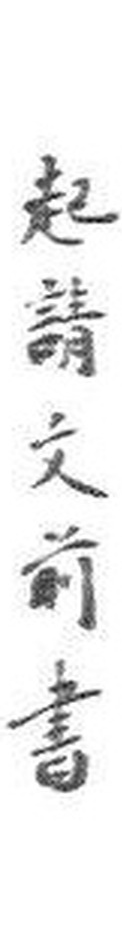起請文前書
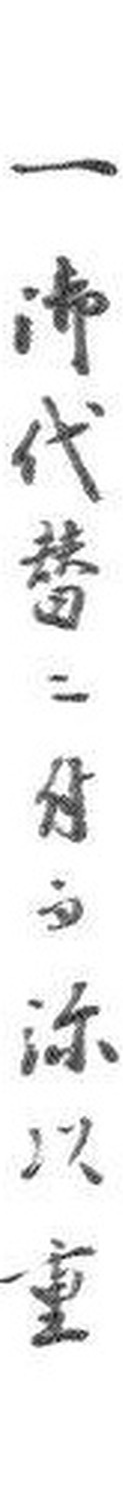一御代替ニ付而弥以重
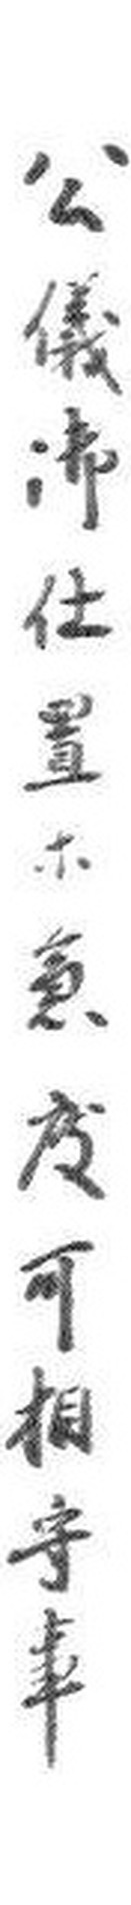公儀御仕置等急度可相守事
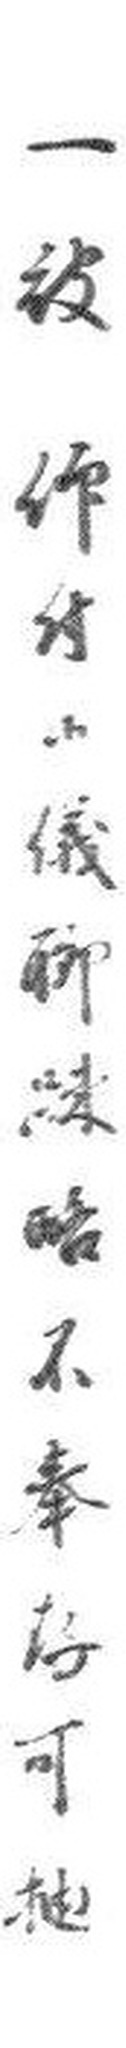一被仰付候儀聊概略不奉存可抽

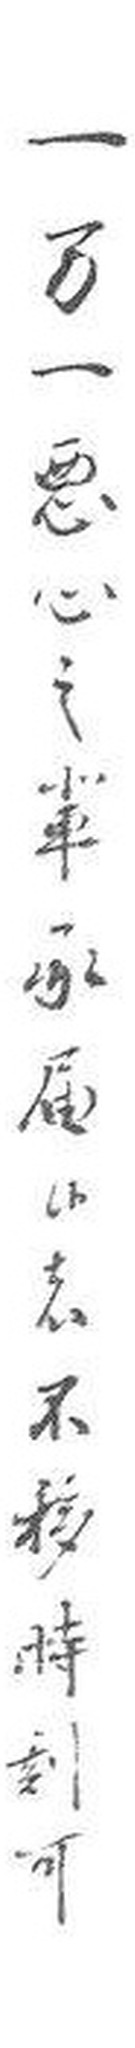一万一悪心之輩承届候者不移時刻可
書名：家譜 二十九 吉邦公 従正徳二年到正徳三年
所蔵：福井県文書館 Fukui Prefectural Archives
